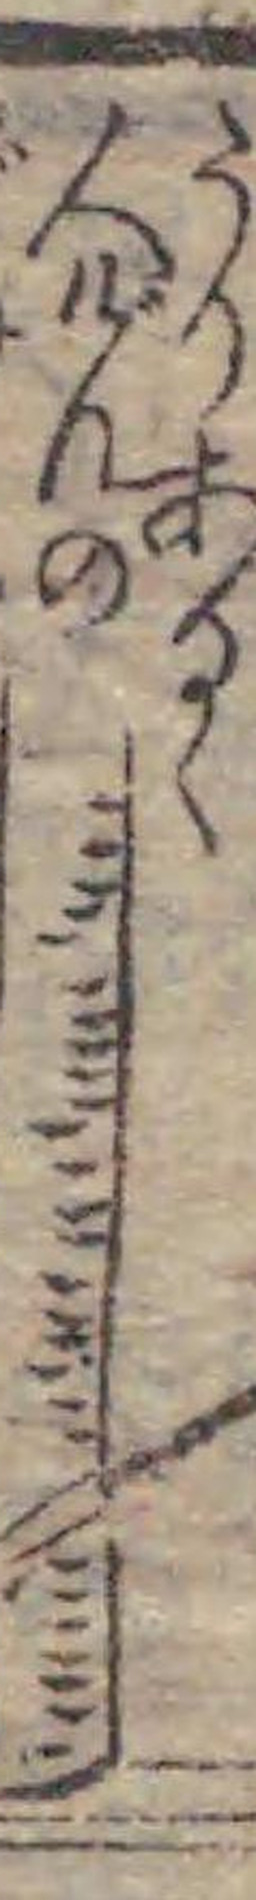人げんの
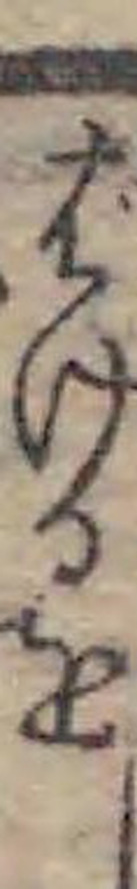ばけるを
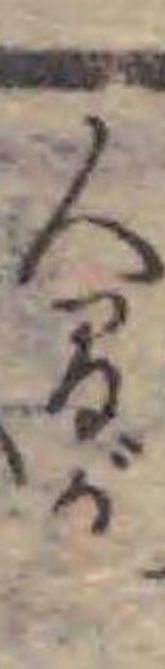人間が
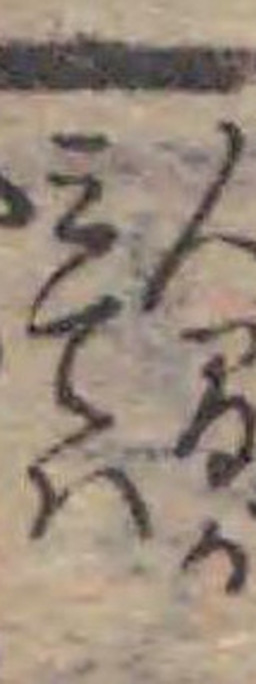みては
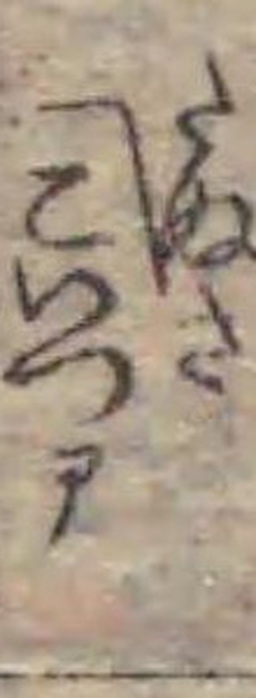〽こいつァ
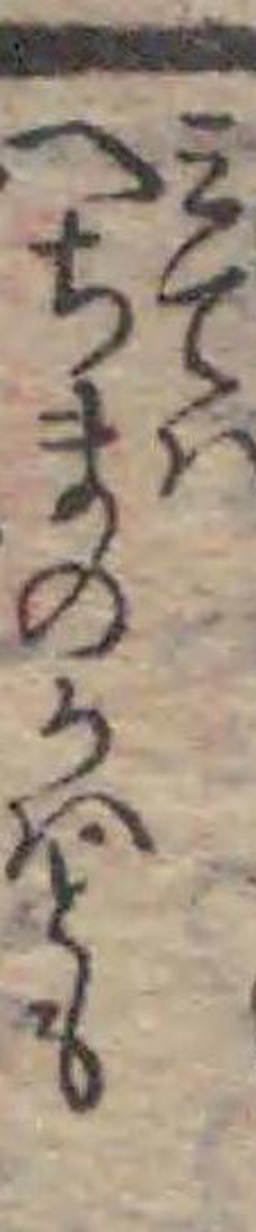へちまのかはとも
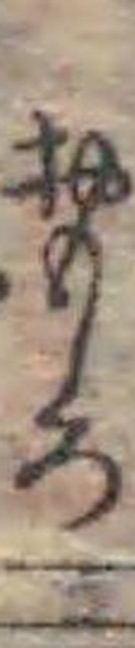おもしろ
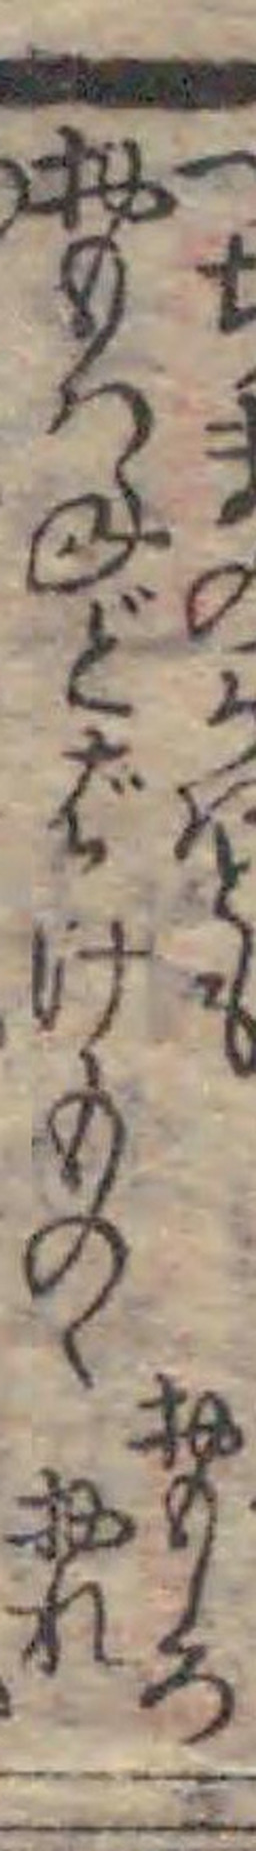おもはねどばけものゝ
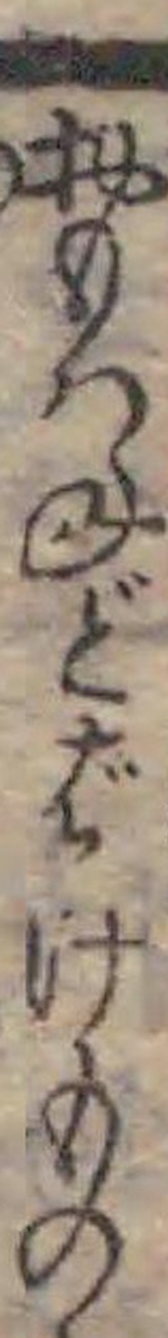おもはねどばけものゝ
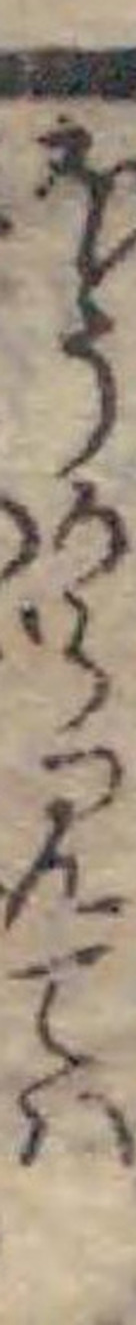ほうから見ては
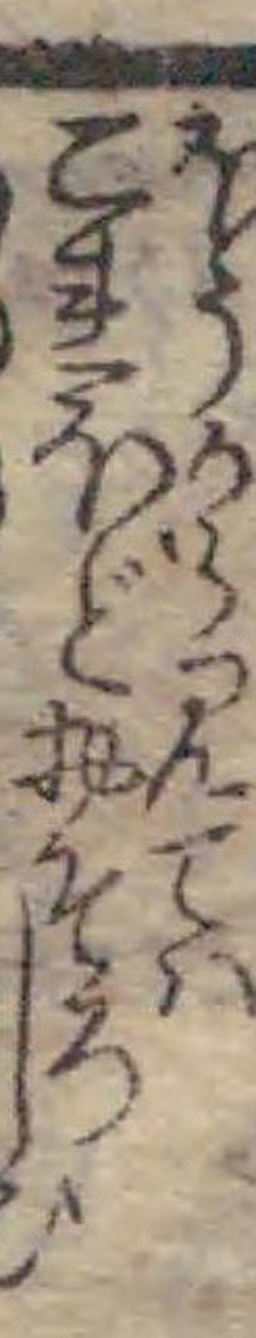これほどおそろしひ
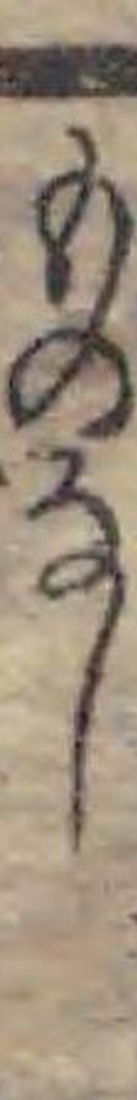ものなし
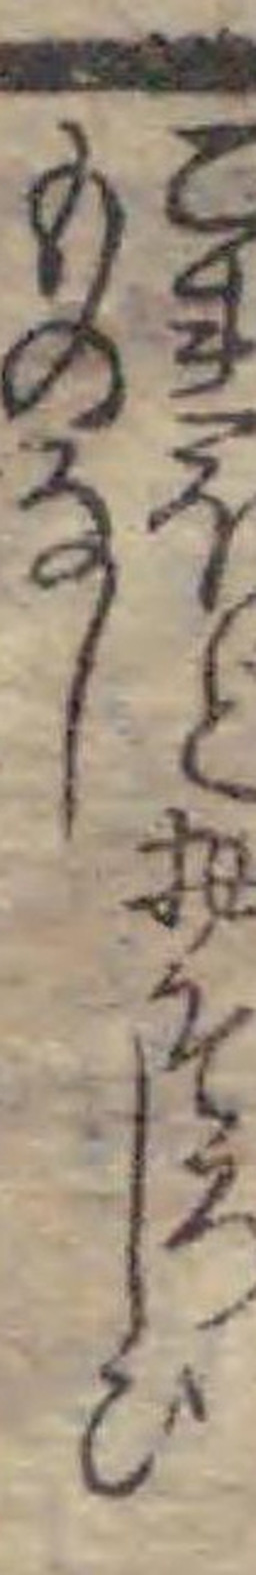ものなし
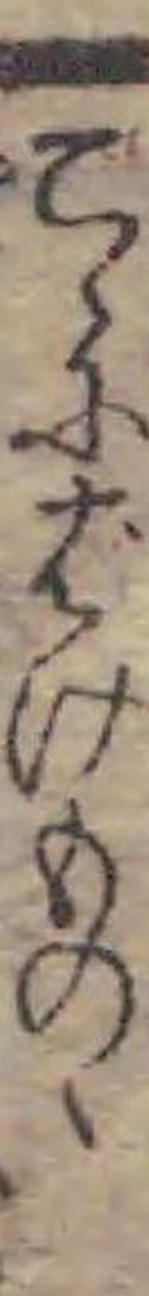こゝにばけものゝ
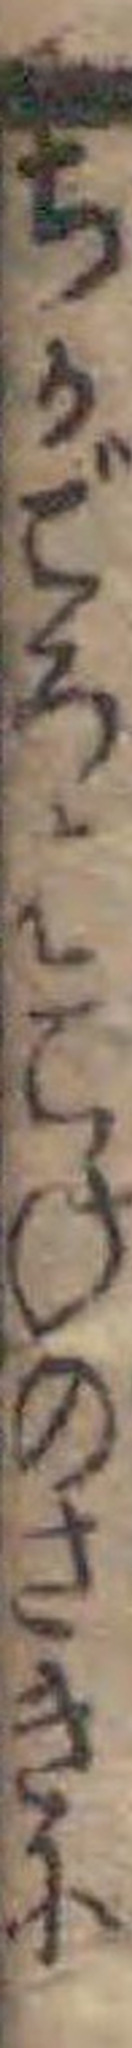ちかごろはこねのさきに
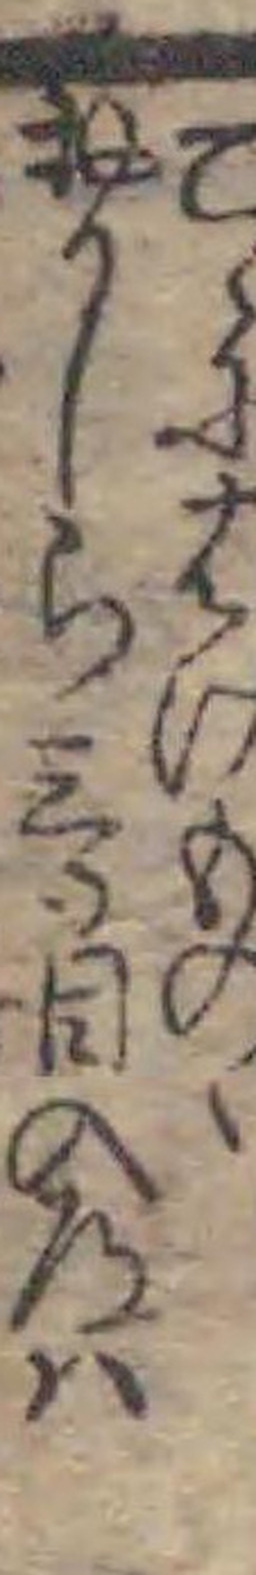おかしら三つ目入道は
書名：怪物つれつれ草 : 2巻
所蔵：国立国会図書館 National Diet Library, JAPAN
